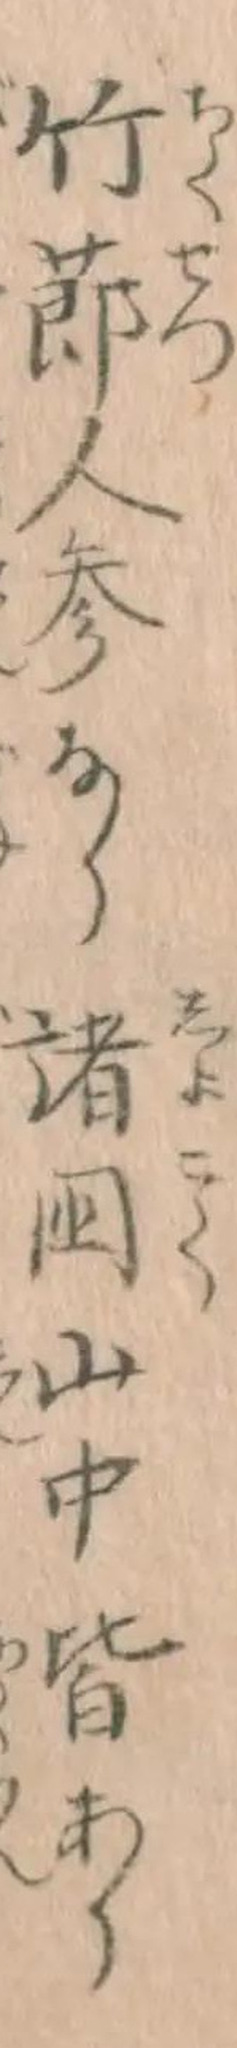竹節人参なり諸国山中皆あり
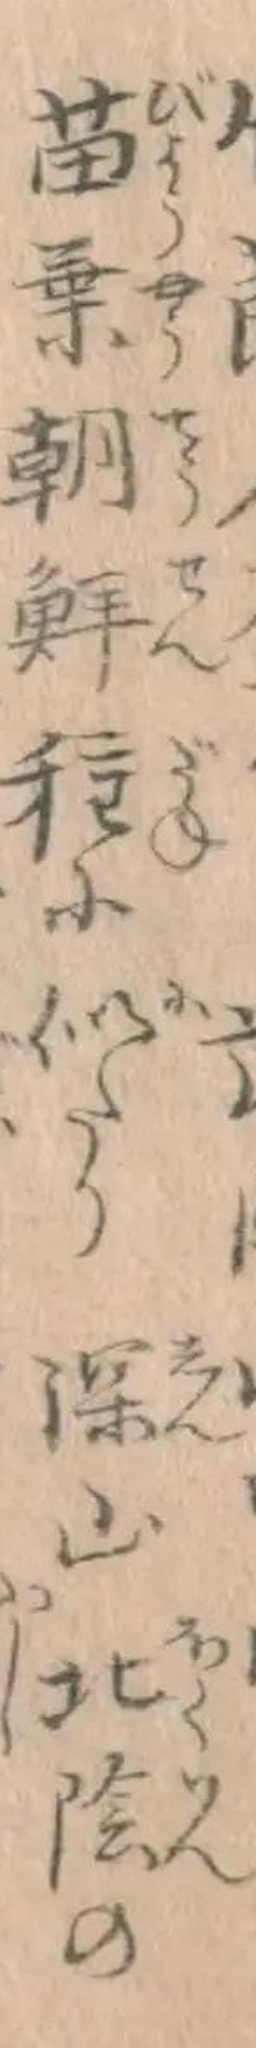苗葉朝鮮種に似たり深山北陰の
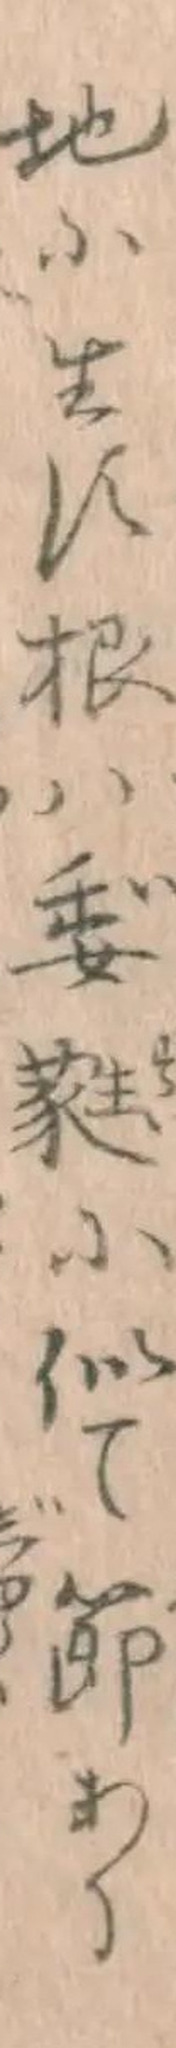地に生す根は委蕤に似て節あり
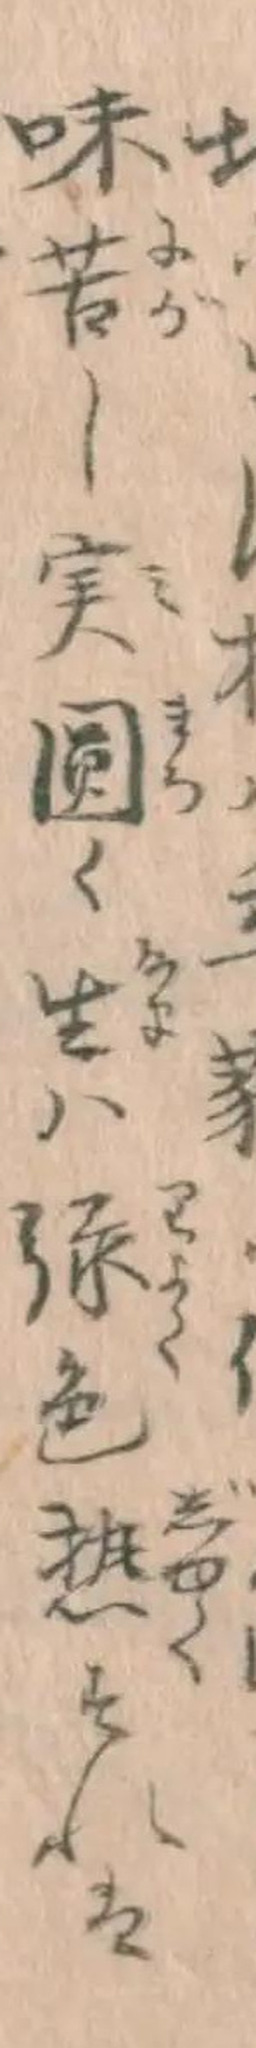味苦し実円く生は緑色熟すれは
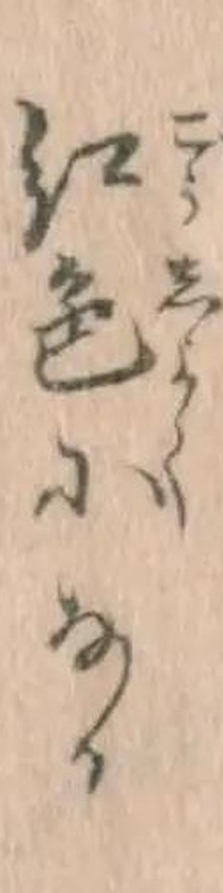紅色になる

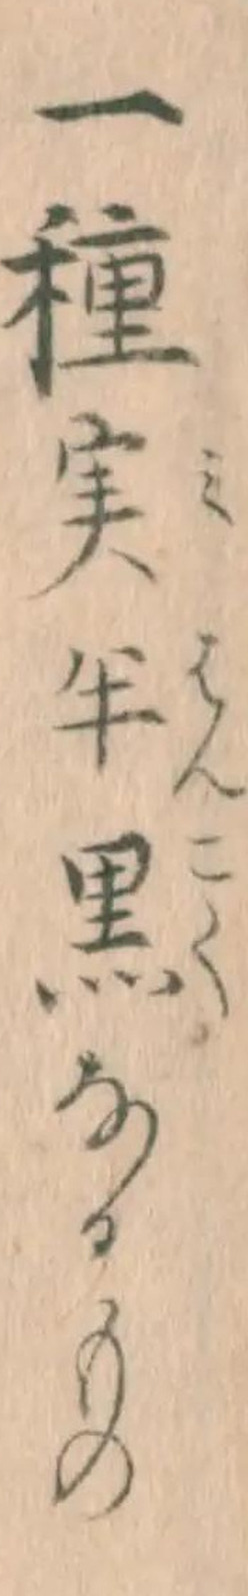一種実半黒なるもの
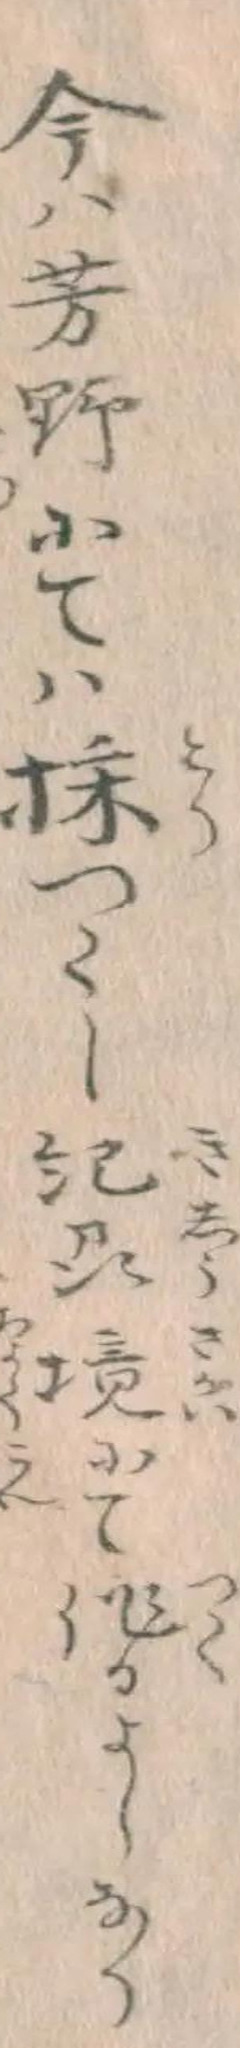今は芳野にては採つくし紀州境にて作るよしなり
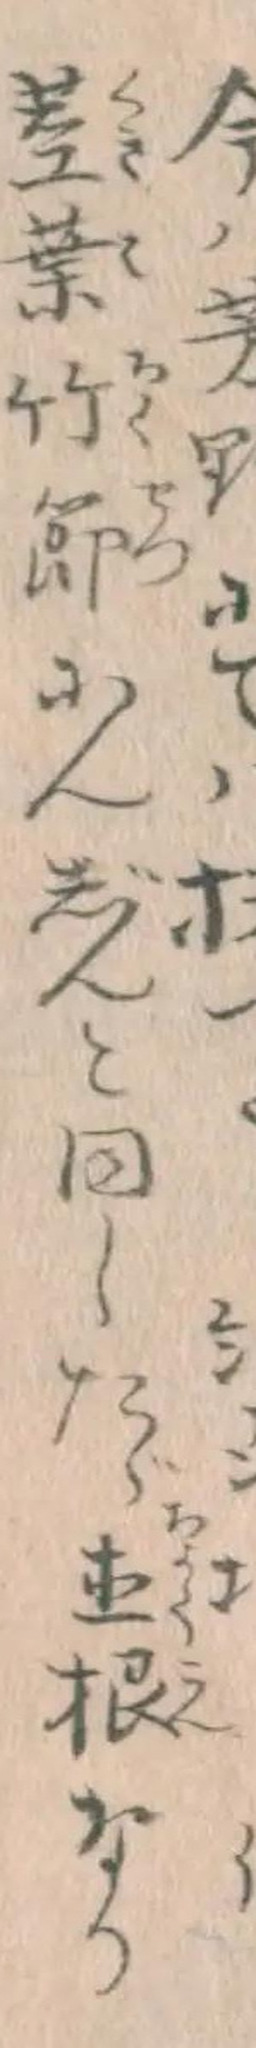茎葉竹節にんじんと同したゞ直根なり

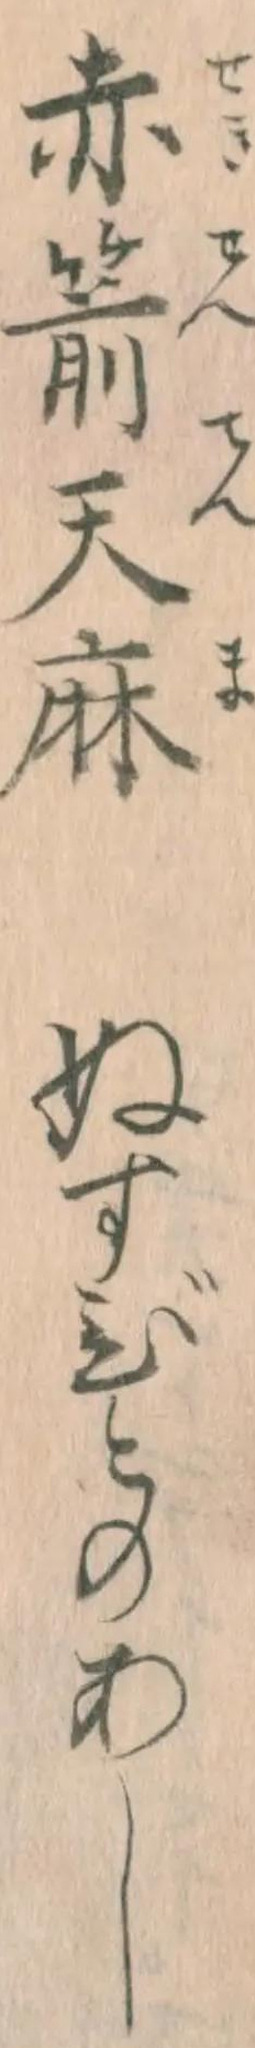赤箭天麻ぬすびとのあし
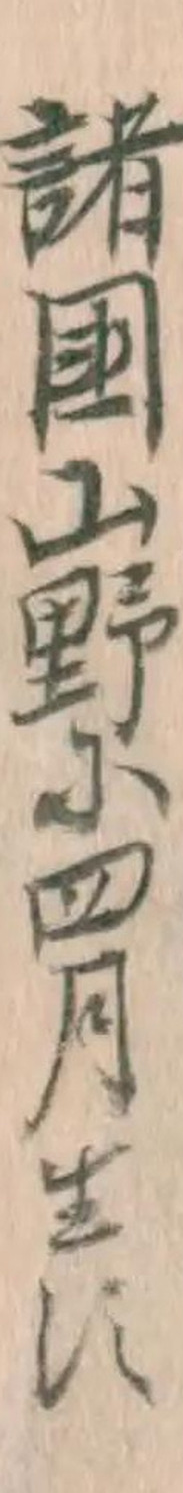諸国山野に四月生す
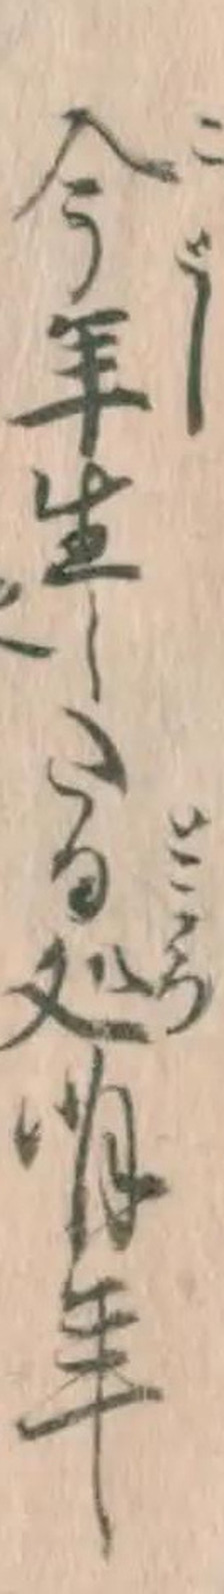今年生したる処明年
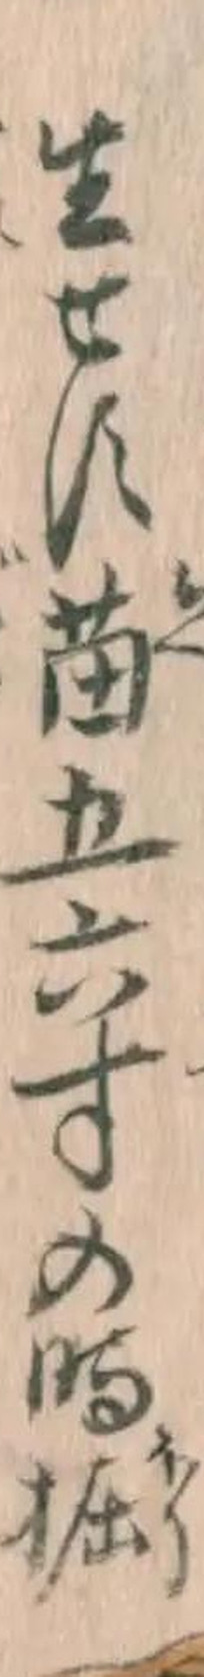生せす苗五六寸の時掘
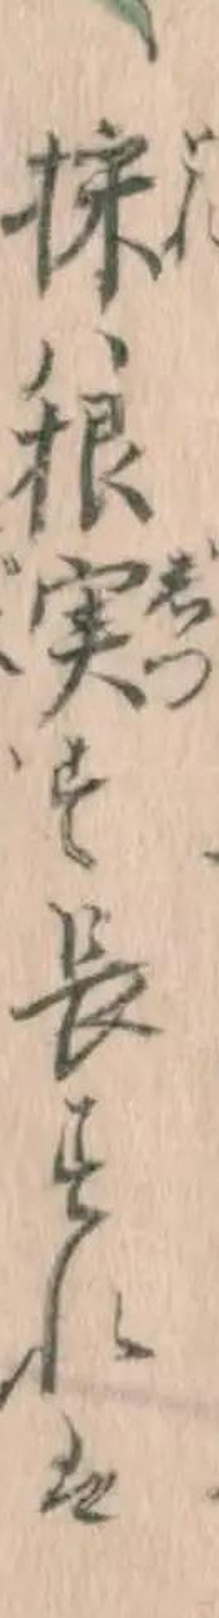採は根実す長すれは
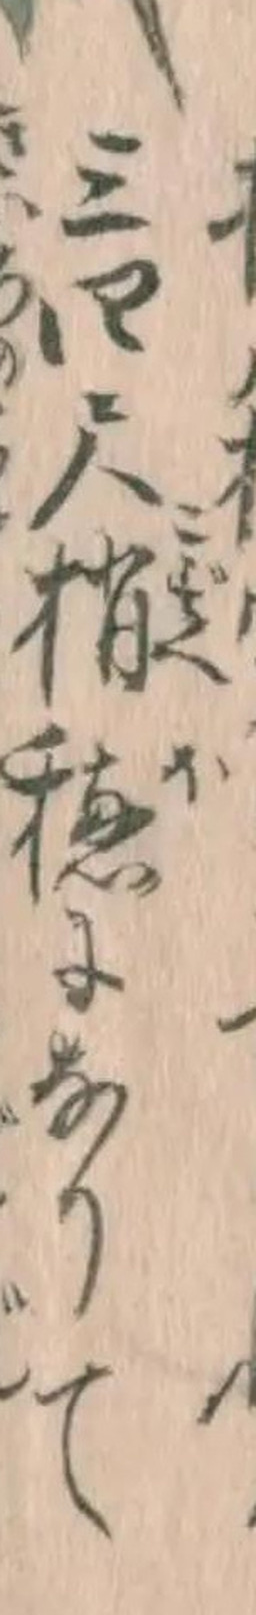三四尺梢穂になりて
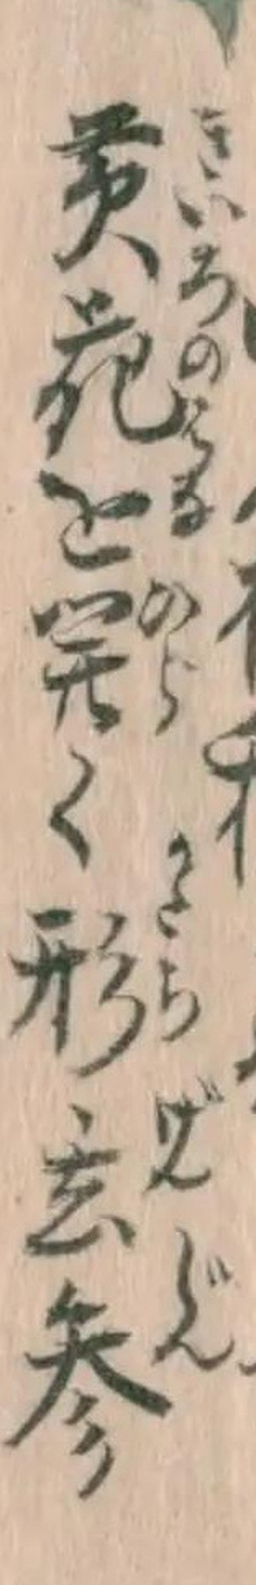黄花を開く形幻参
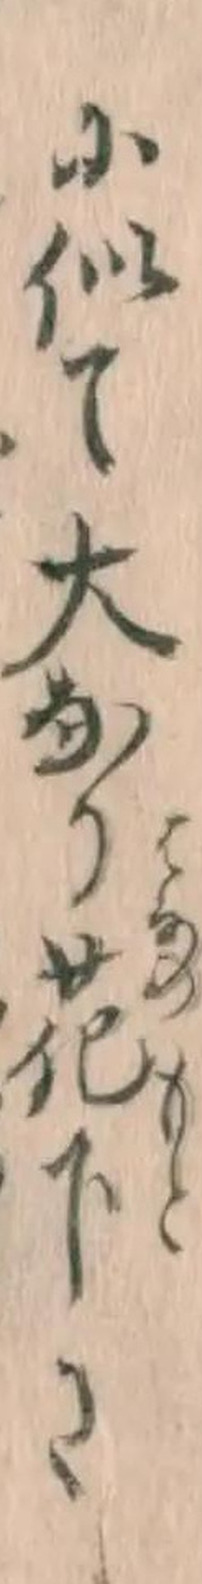に似て大なり花下に
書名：本草図譜. 巻5-6
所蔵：国立国会図書館 National Diet Library, JAPAN
